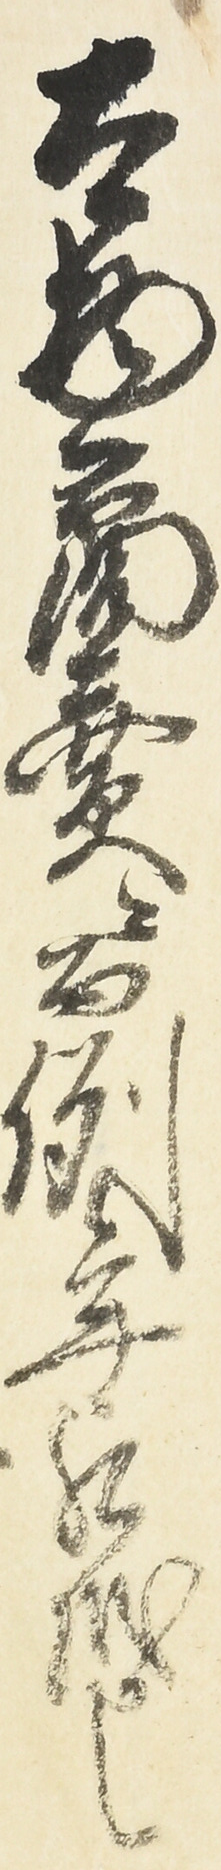太物商売ニ而例年罷越申候
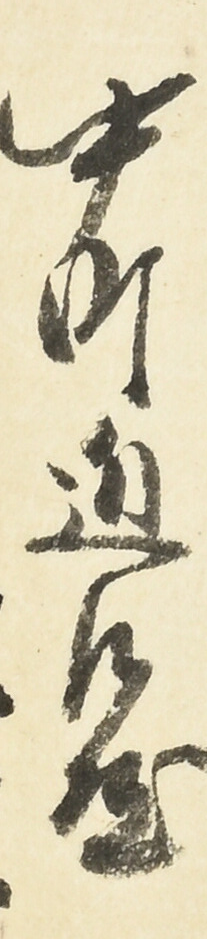中町近江屋
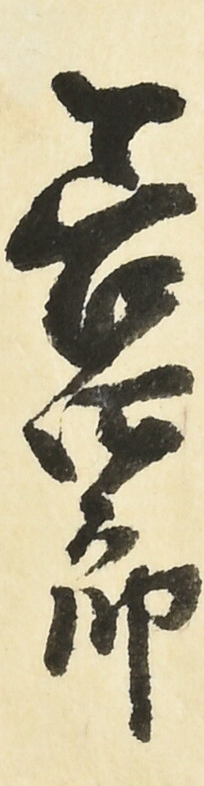善四郎
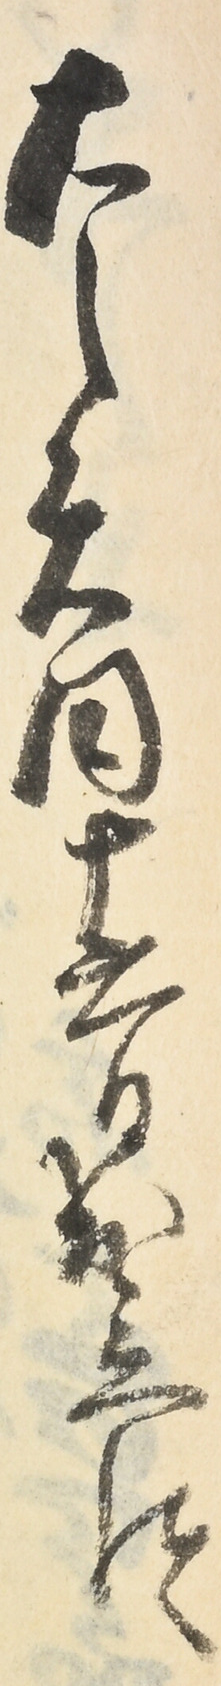右之者同十日出立仕候

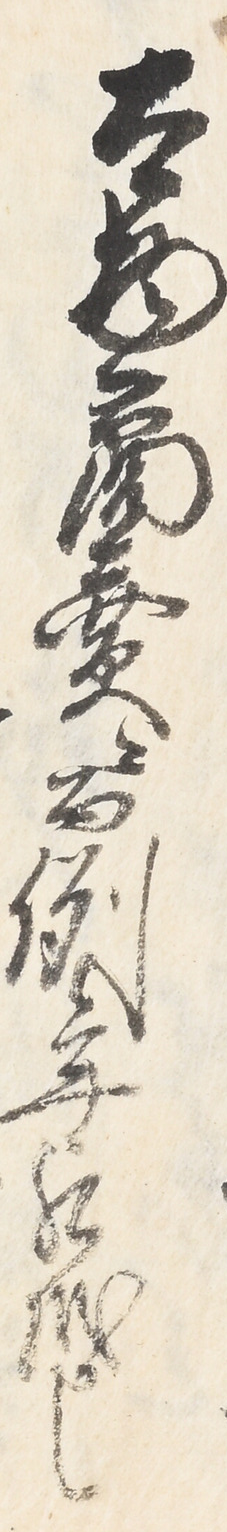小間物商売ニ而例年罷越申候
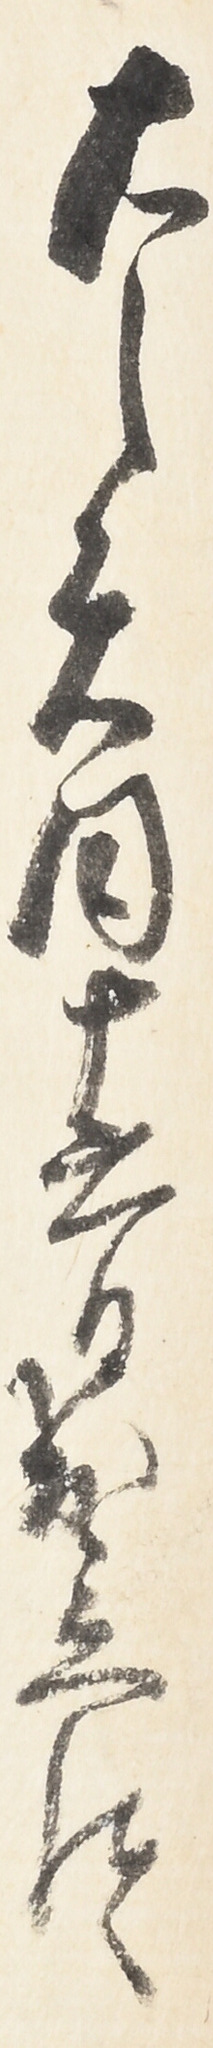右之者同十六日出立仕候
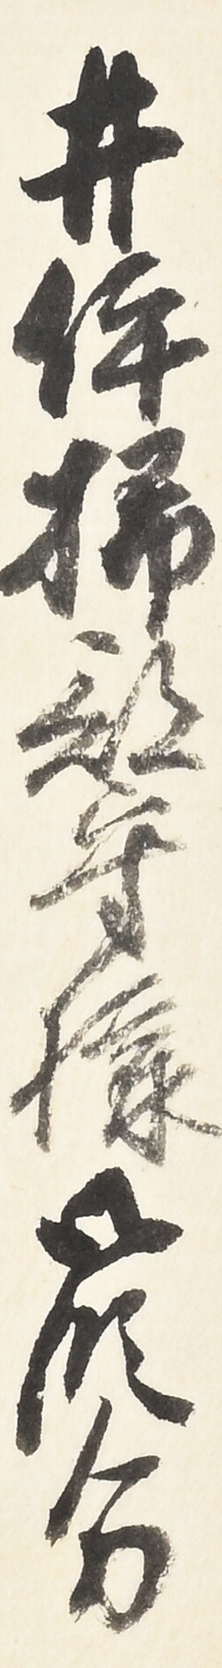井伊掃部守様御領分
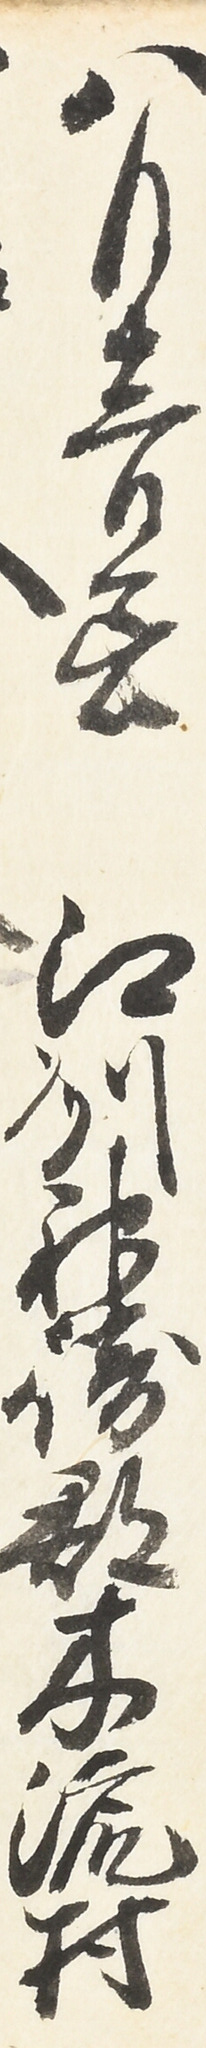八月十二日着江州神崎郡木流村
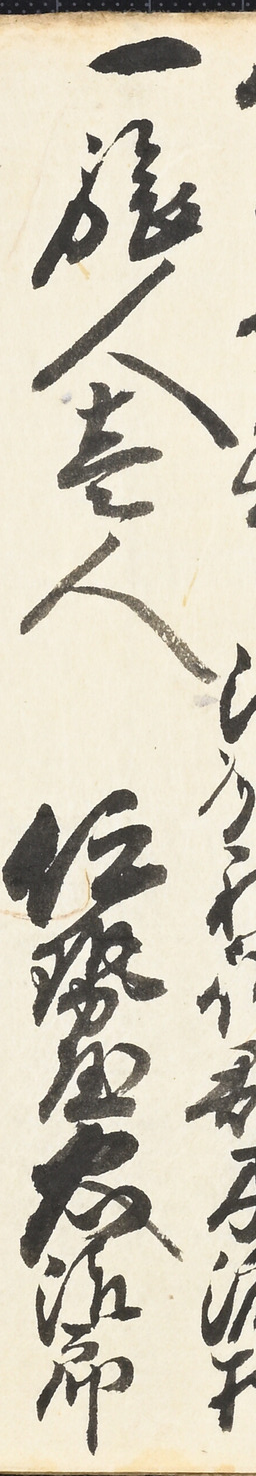一旅人壱人伊勢屋右治郎
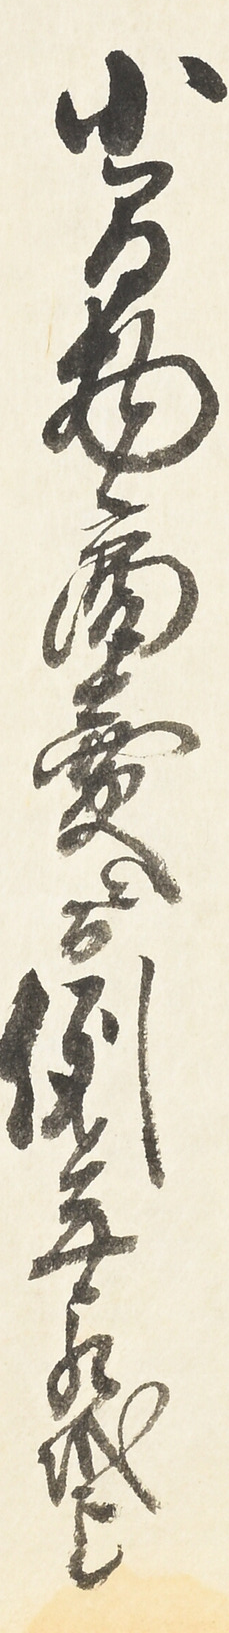小間物商売ニ而例年罷越申候
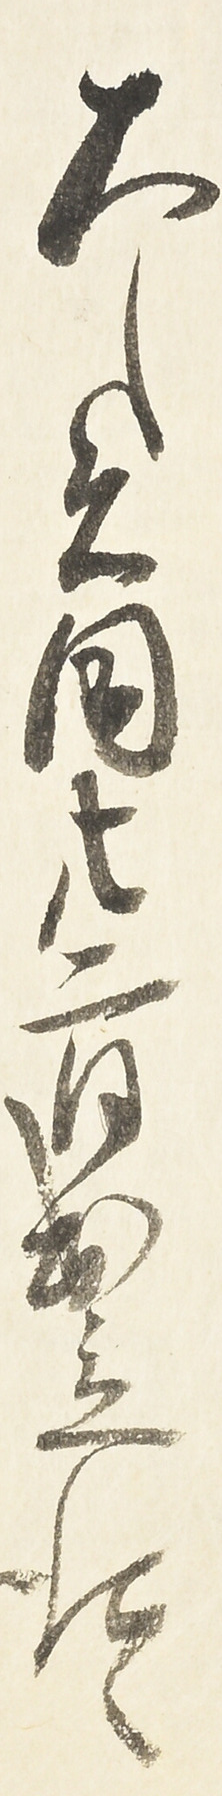右之者同廿二日出立仕候
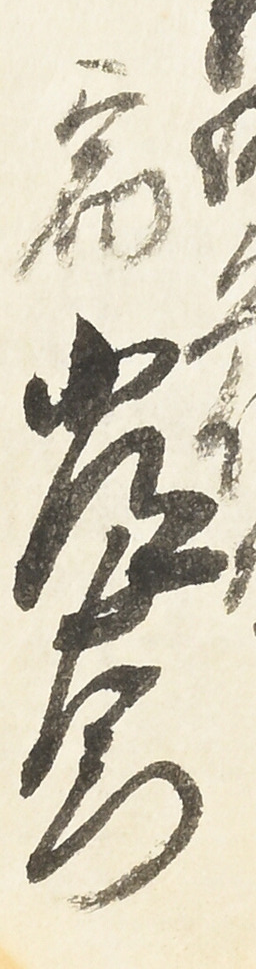宿常右衛門
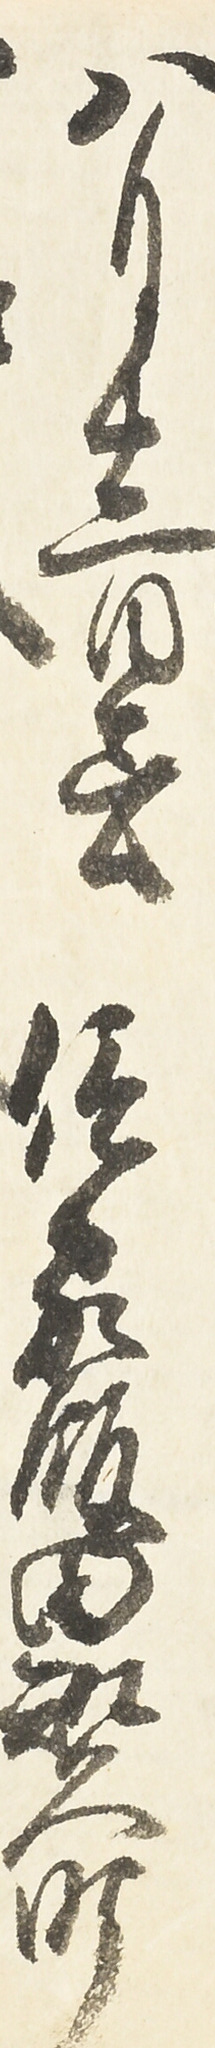八月十二日着信州飯田知久町
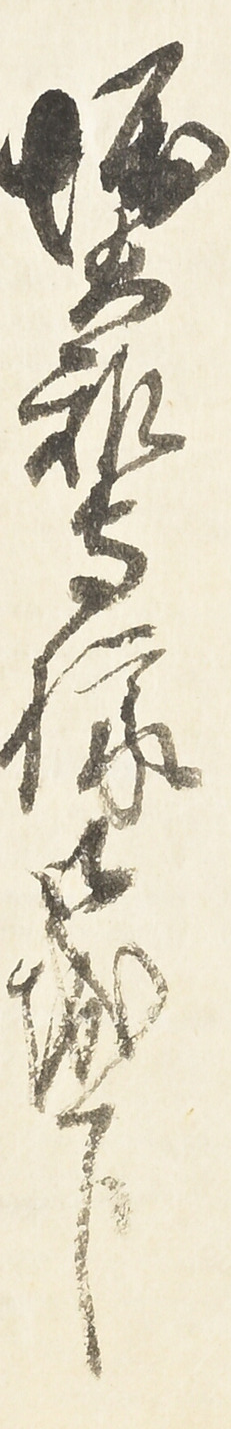堀大和守様御城下
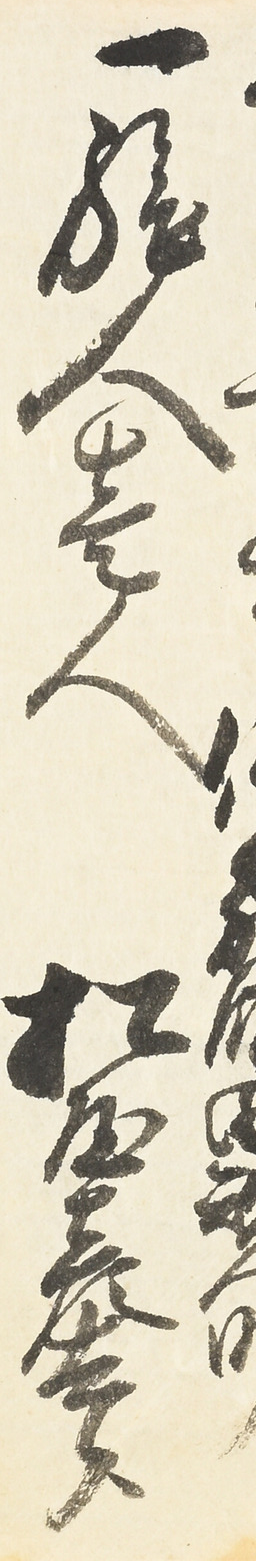一旅人壱人松屋彦太郎
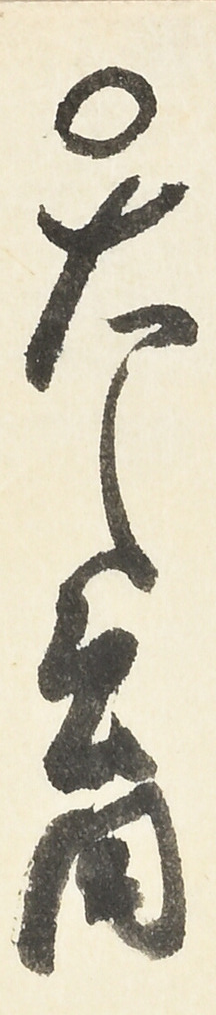〇右之者同
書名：町中旅人泊控帳
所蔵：伊那市立高遠町図書館・合同会社AMANE
